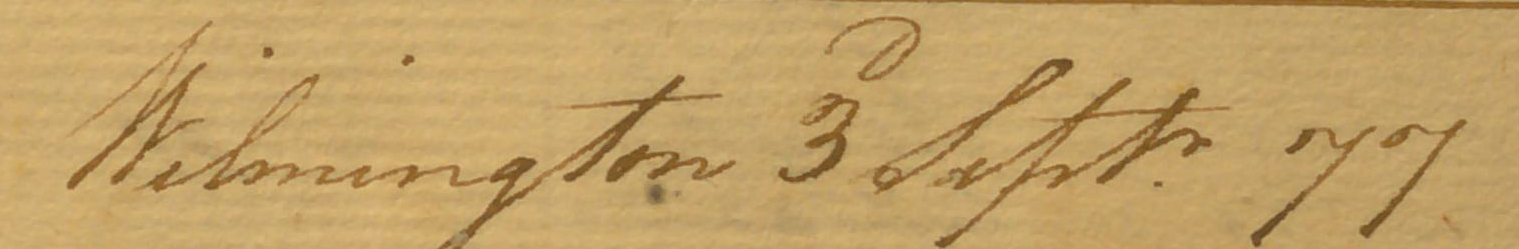Wilmington 3^d Sept^r. 77
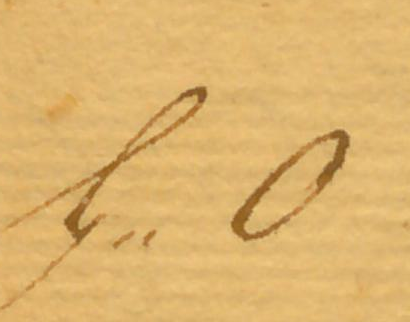G.O
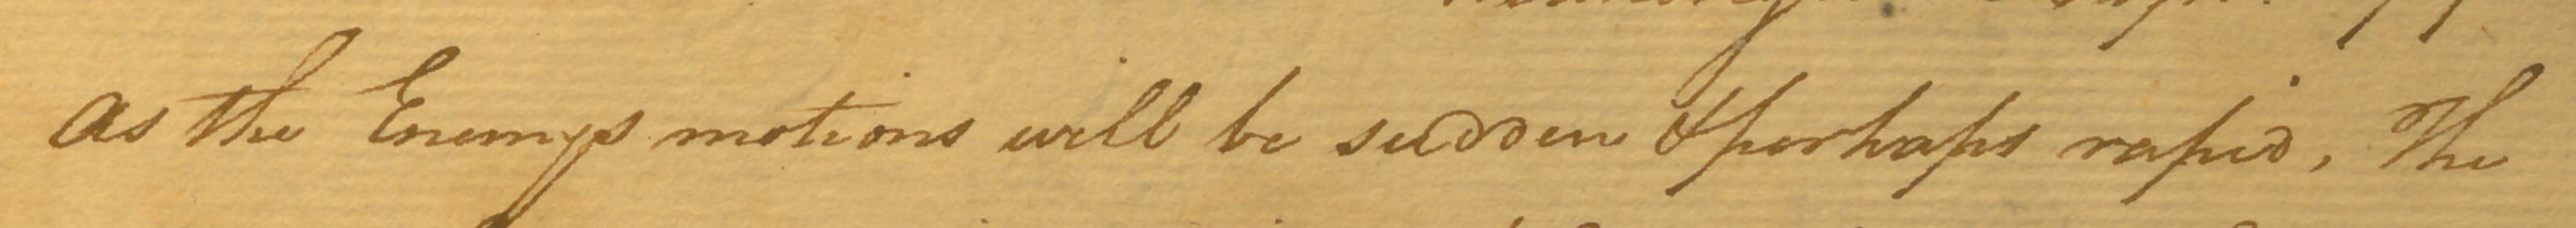As the Enemys motions will be sudden & perhaps rapid, The
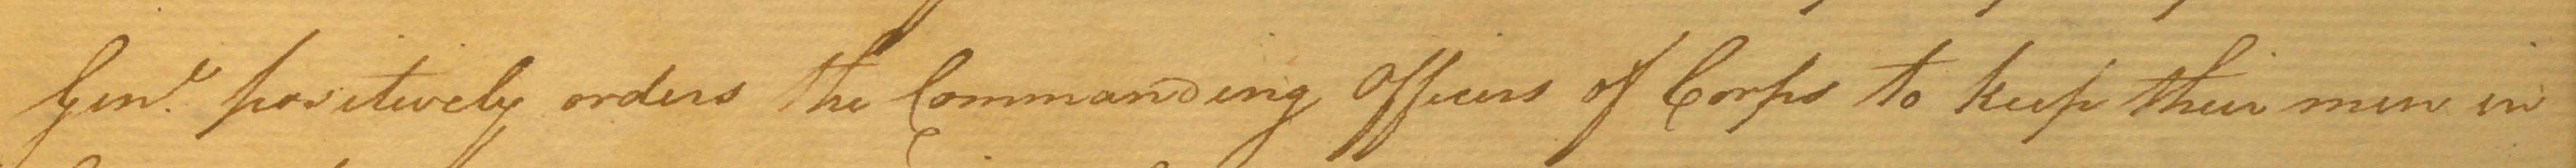Gen^l. positively orders the Commanding Officers of Corps to keep their men in
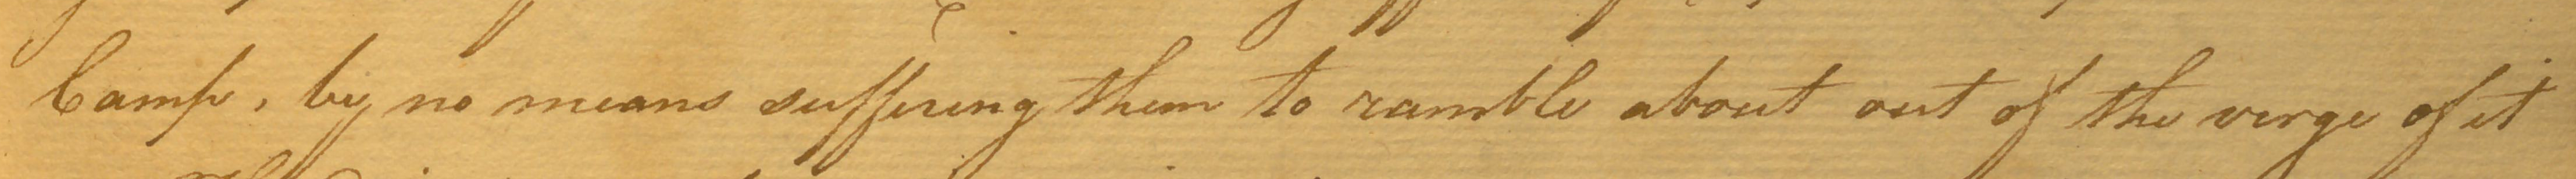Camp, by no means suffering them to ramble about out of the verge of it
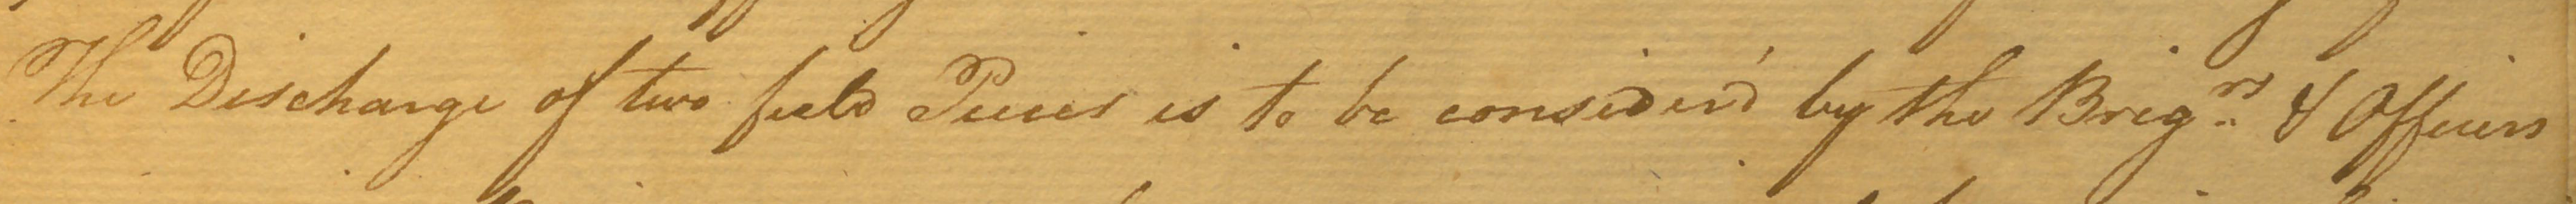The Discharge of two field Pieces is to be consider'd by the Brig^rs. & Officers
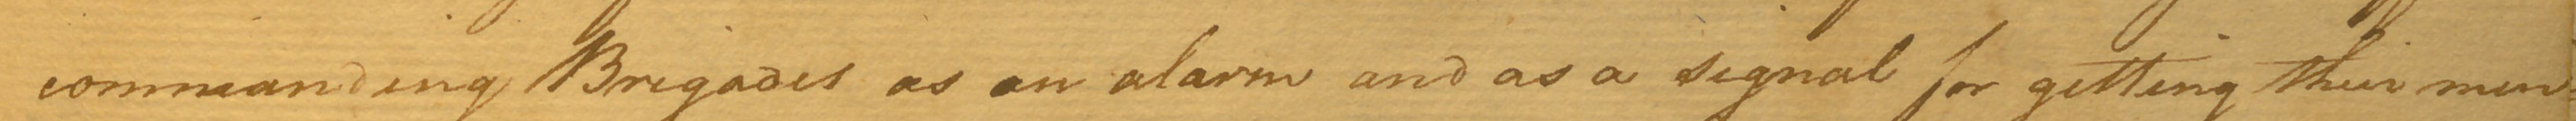commanding Brigades as an alarm and as a signal for getting their men
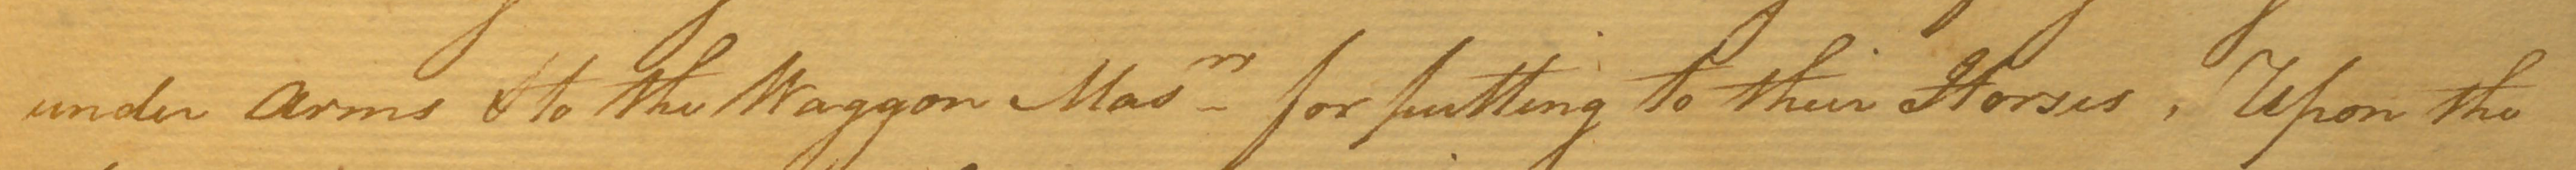under Arms & to the Waggon Mas^rs. for putting to their Horses. Upon the
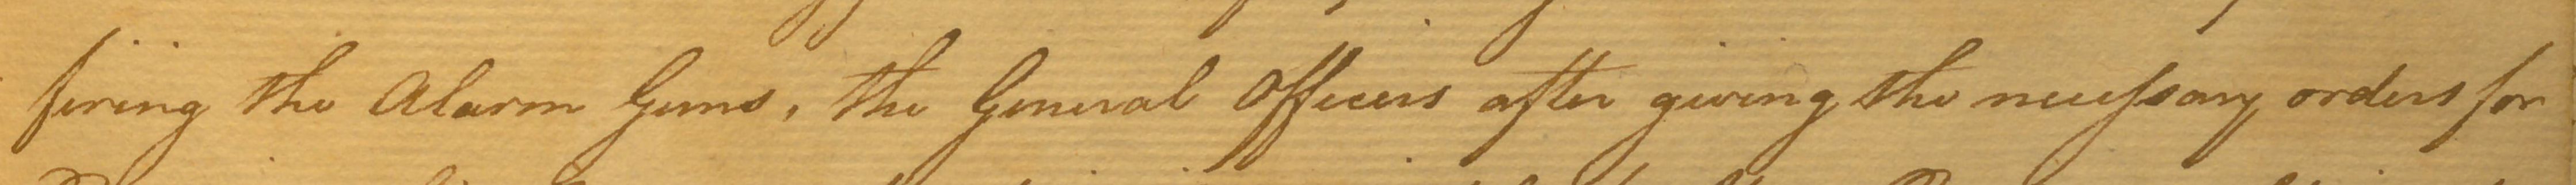firing the Alarm Guns, the General officers after giving the necessary orders for
